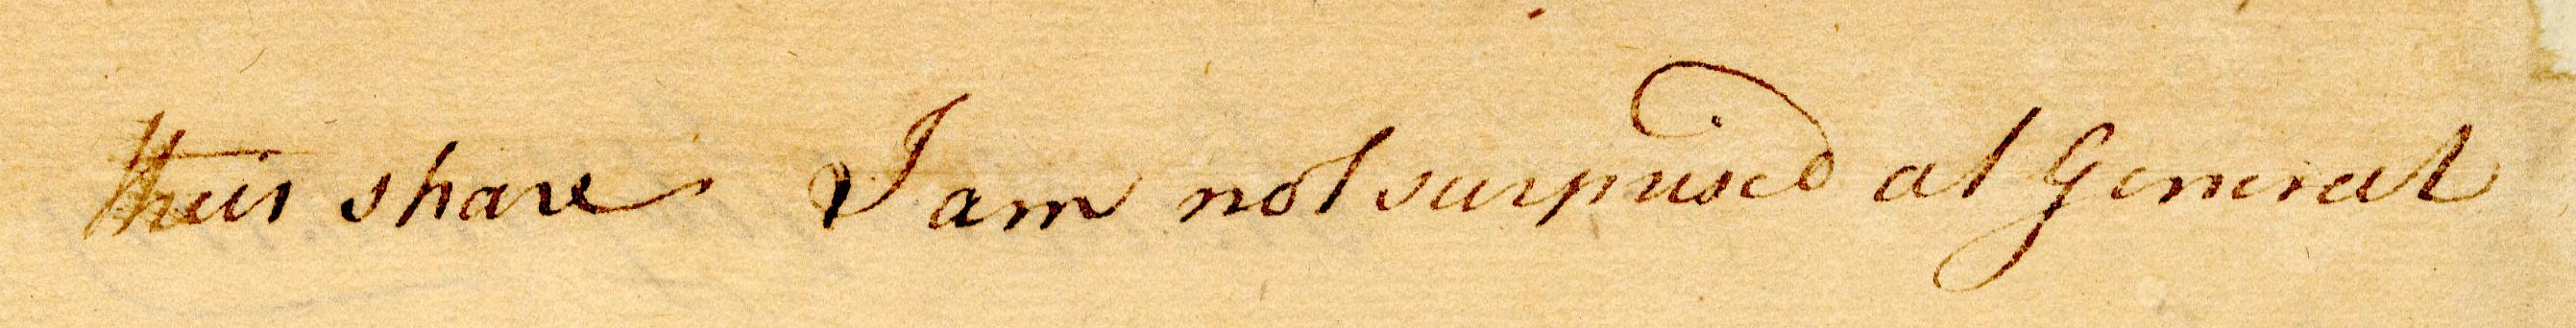their share. I am not surprised at General
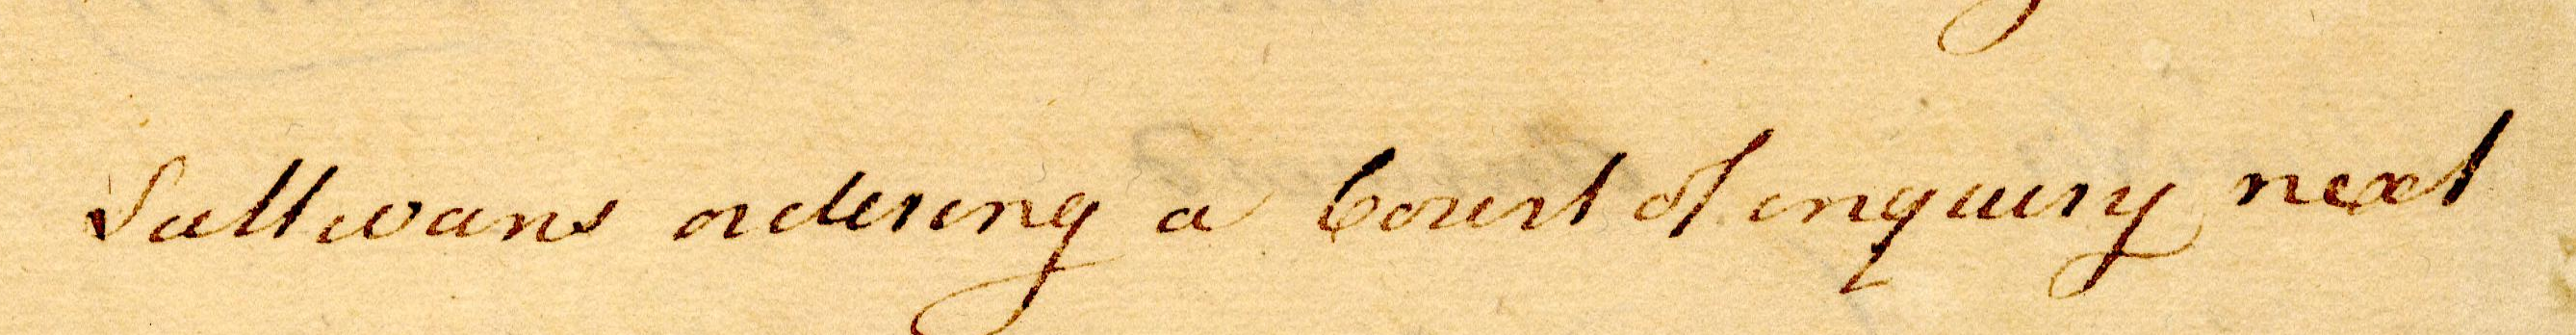Sullivans ordering a Court of inquiry next
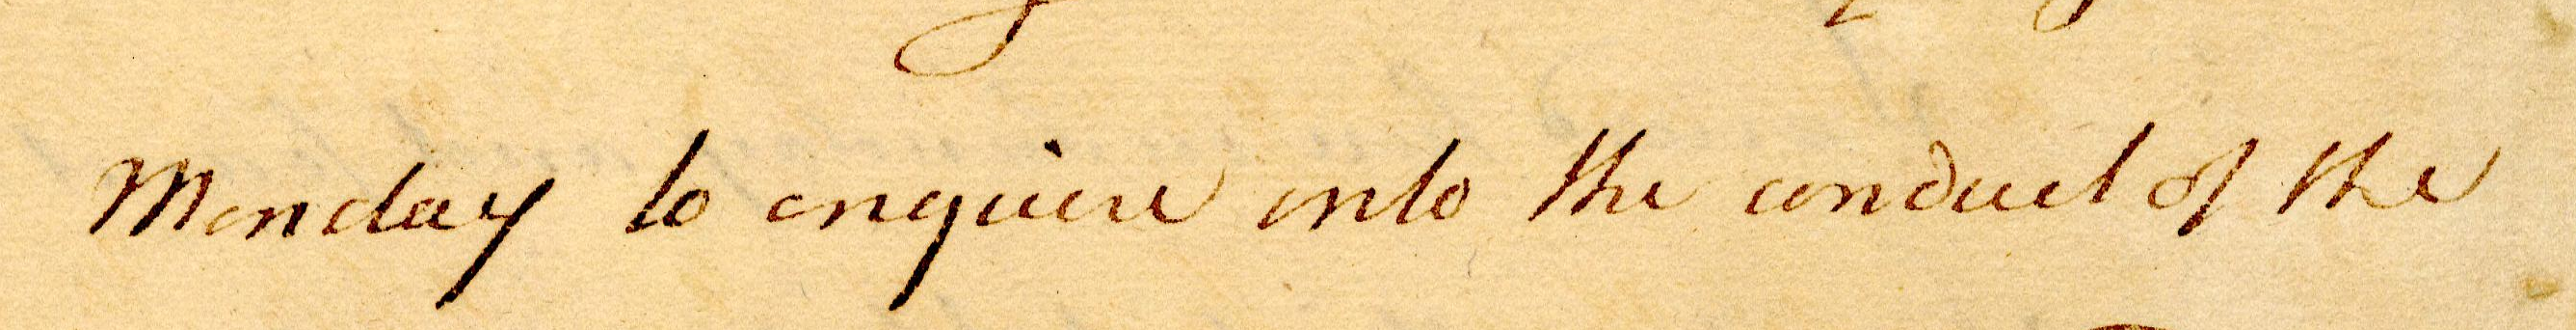Monday to enquire into the conduct of the
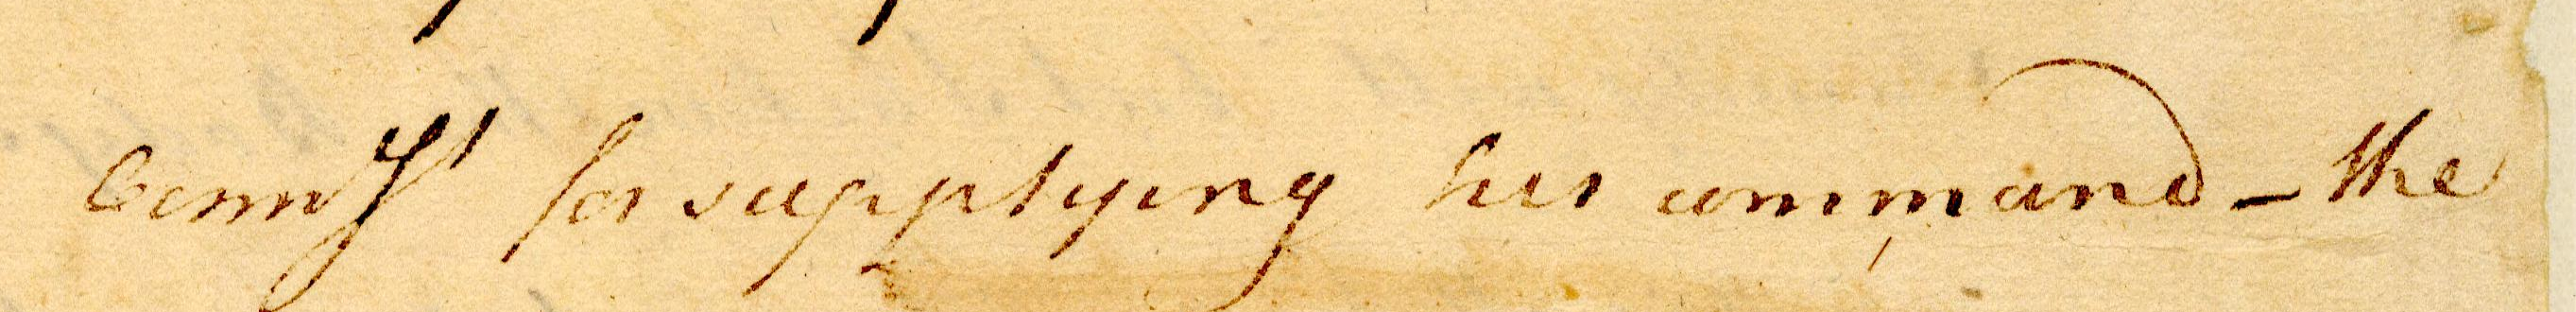Com^ys for supplying his command- the
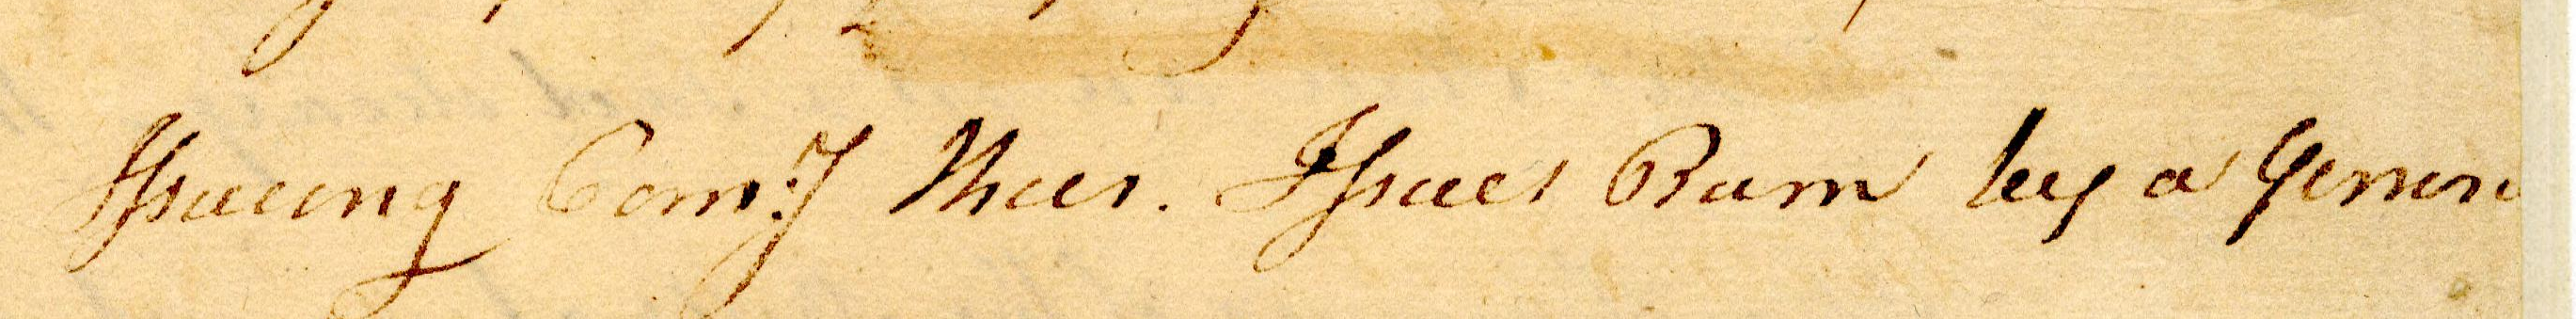Issuing Com^y: then Issues Rum by a Gener[_]
